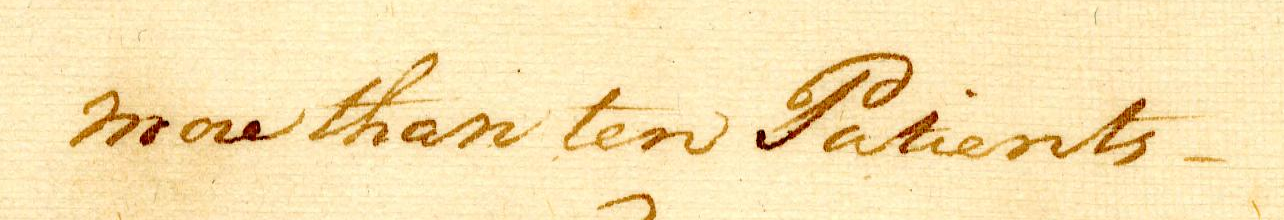more than ten Patients-
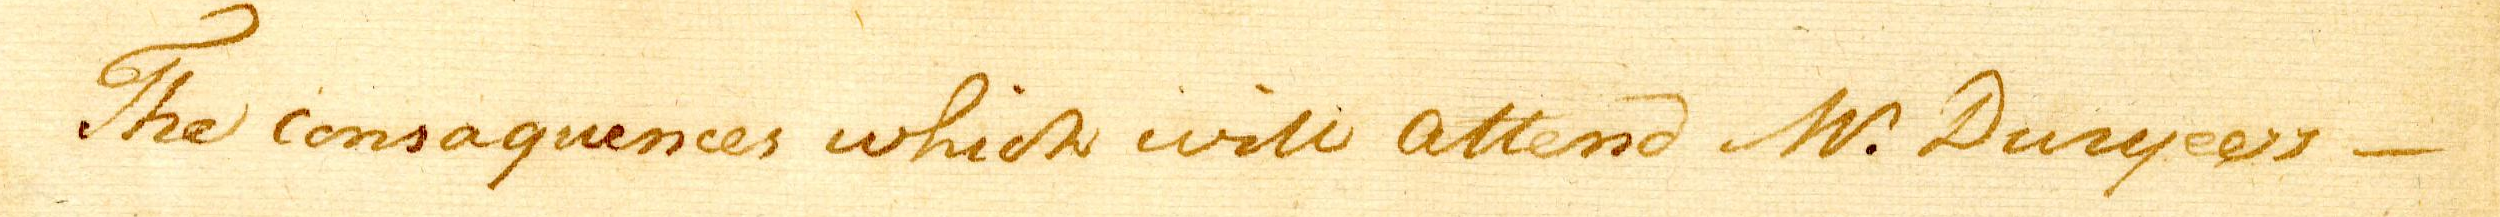The consaquences which will attend M^r. Duryeess-
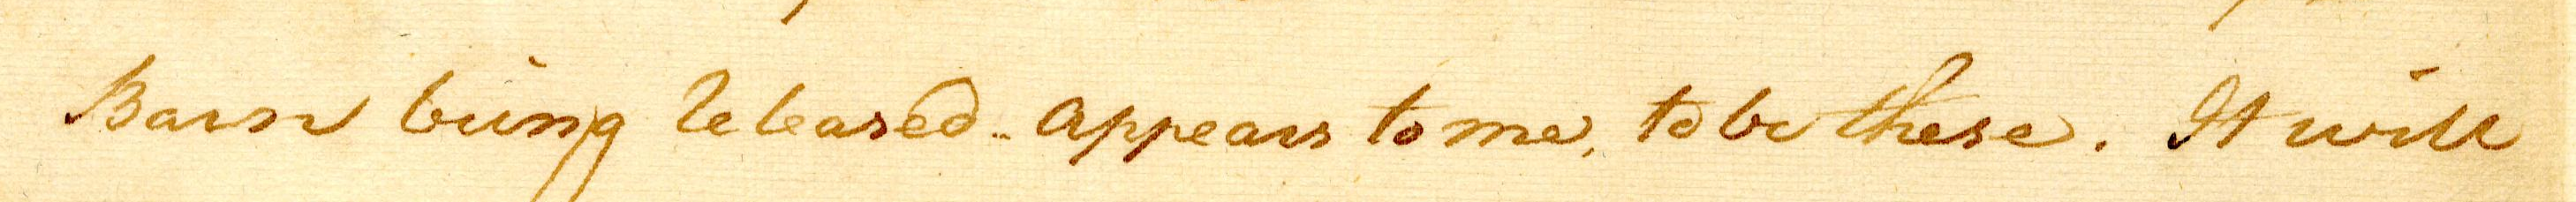Barn being released apperas to me to be these. It will
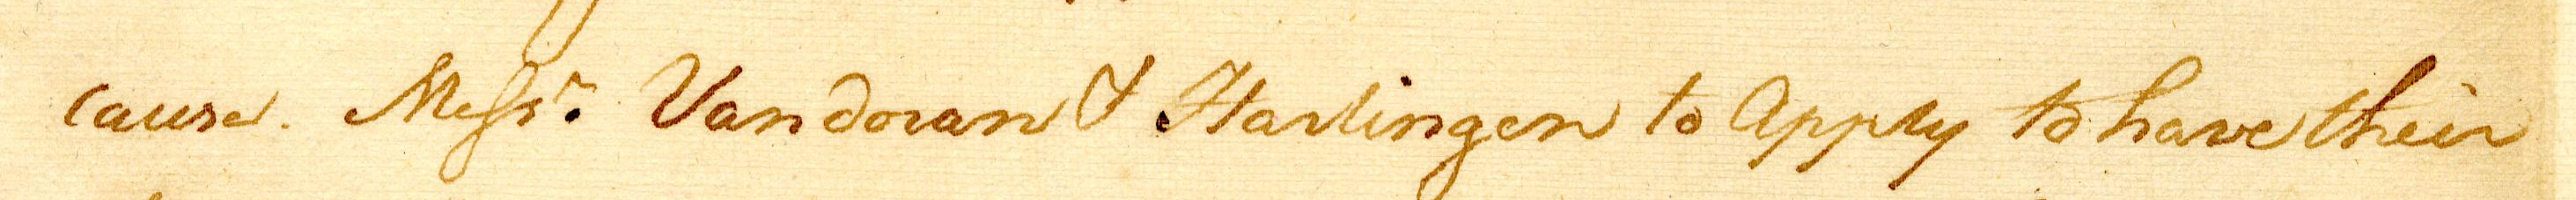cause Mess^r. Vandoran & Hartingen to Apply to have their
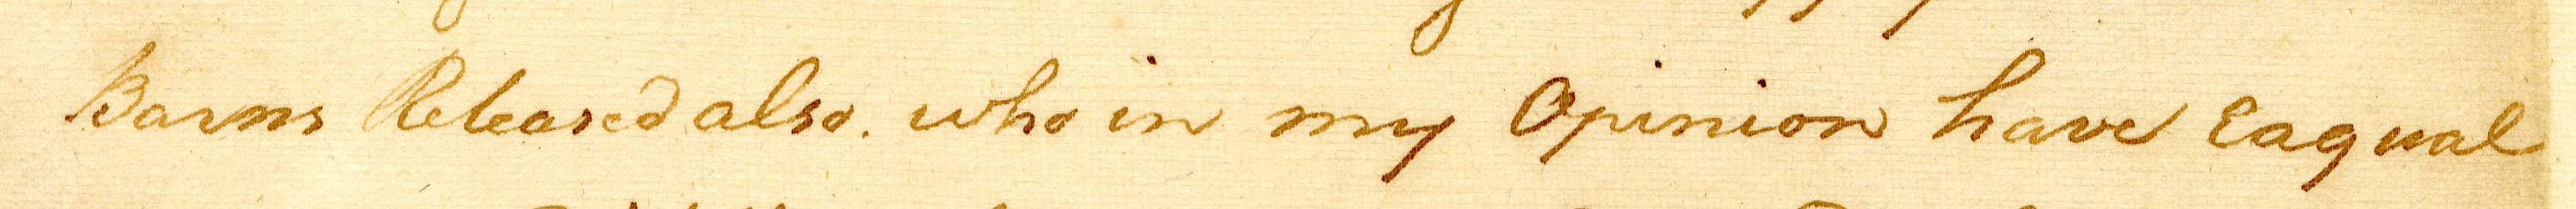Barns Released also. who in my Opinion have Eaqual
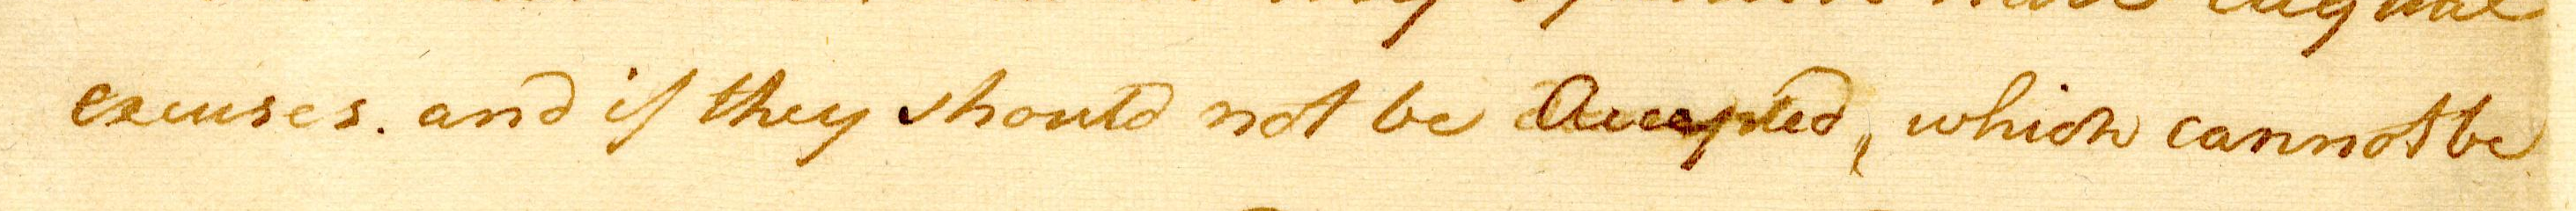excuses. and if they should not be Accepted, which cannot be
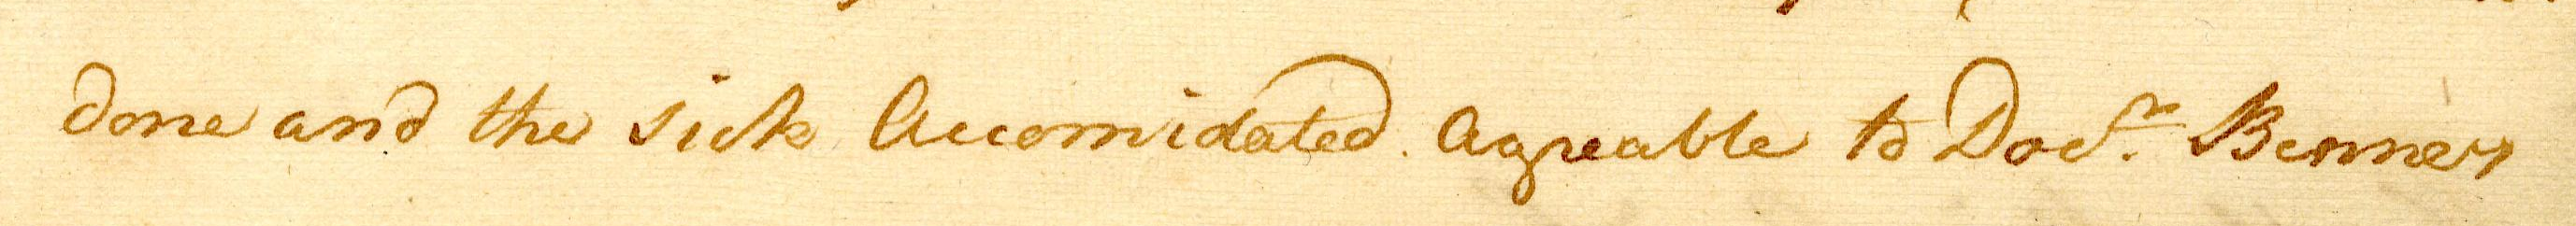done and the sick Accomidated Agreable to Doc^r. Benners
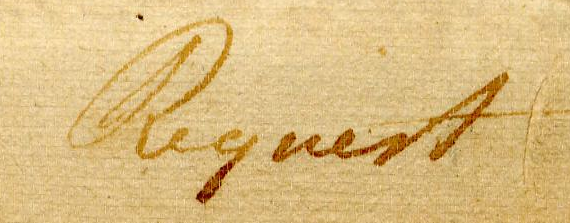Request
